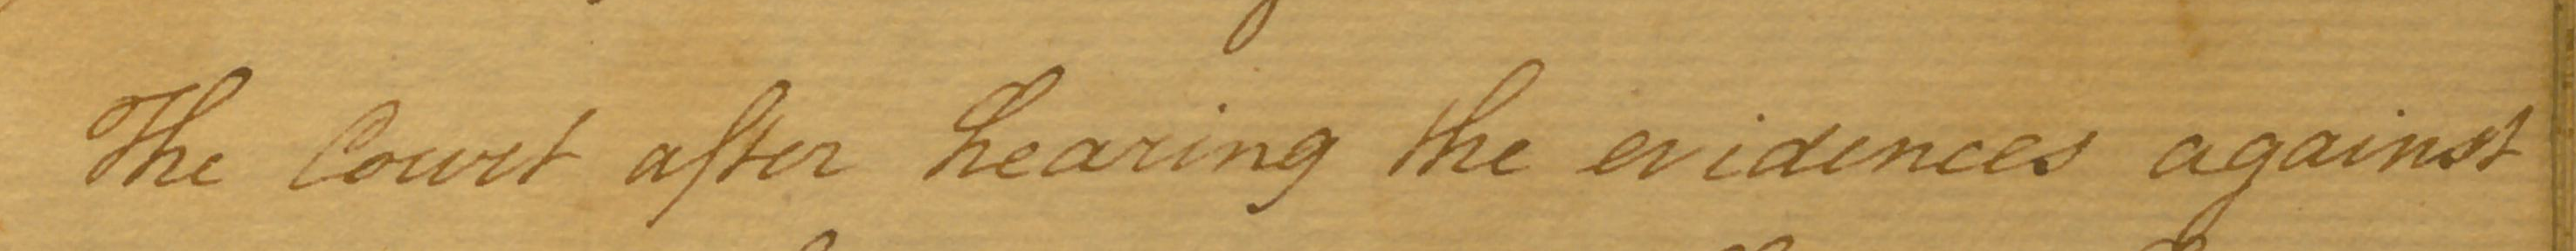The Court after hearing the evidences against
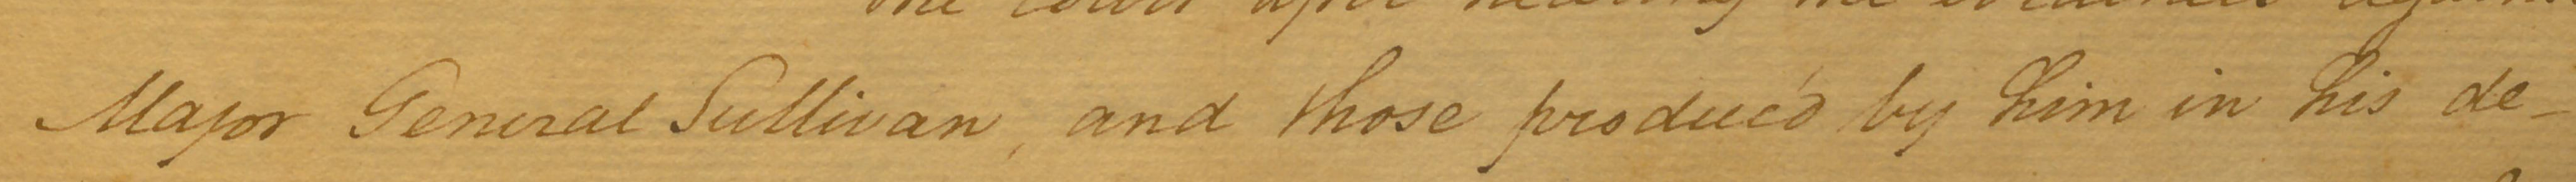Major General Sullivan and those produc'd by him in his de-
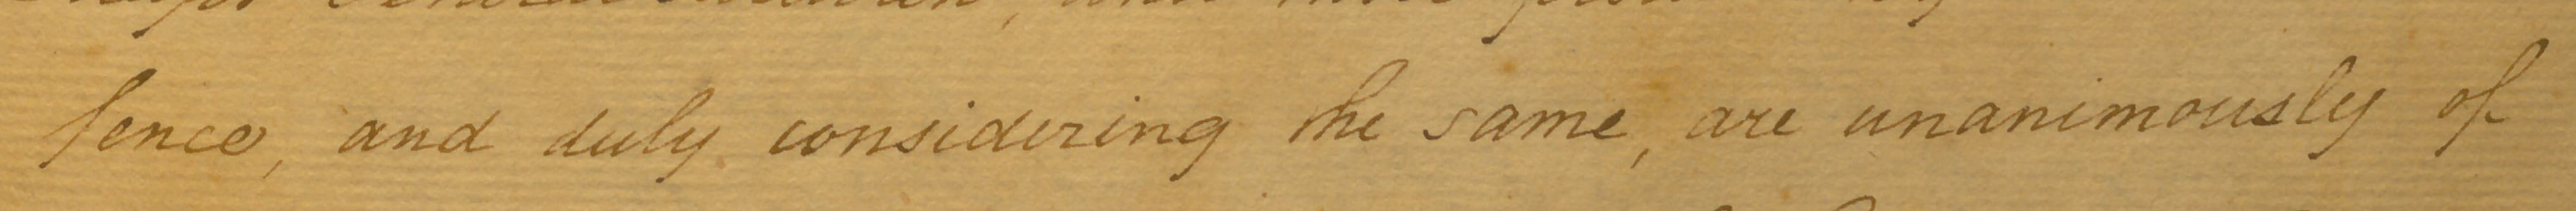fence, and duly considering the same, are unanimously of
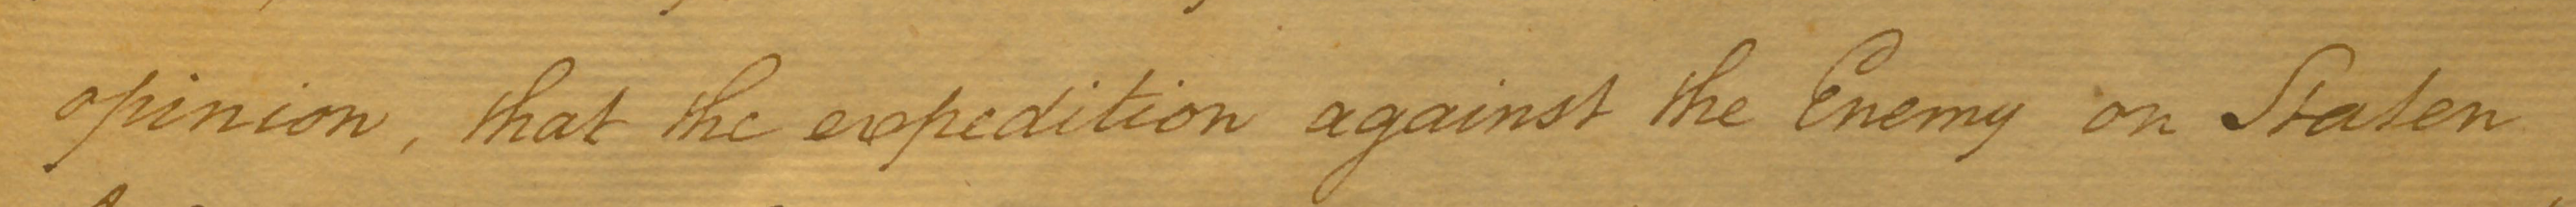opinion, that the expedition against the Enemy on Staten
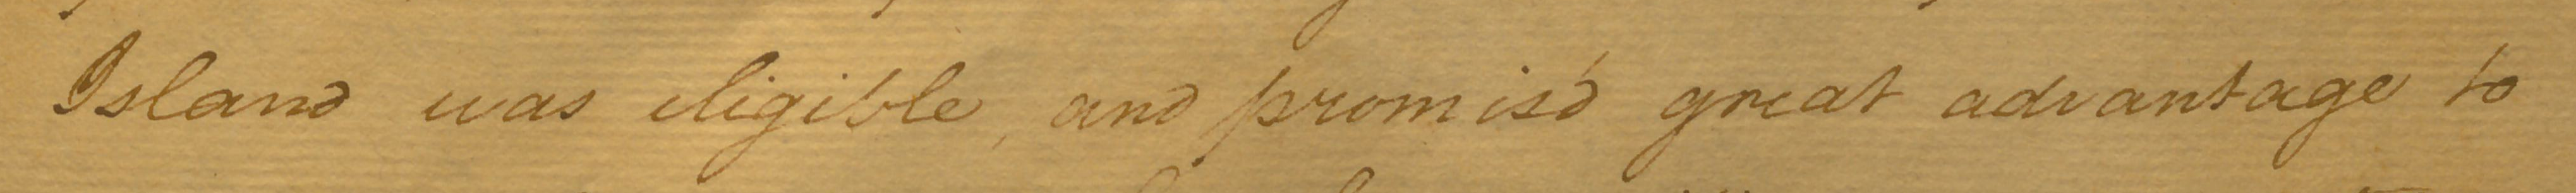Island was eligible, and promisd great advantage to
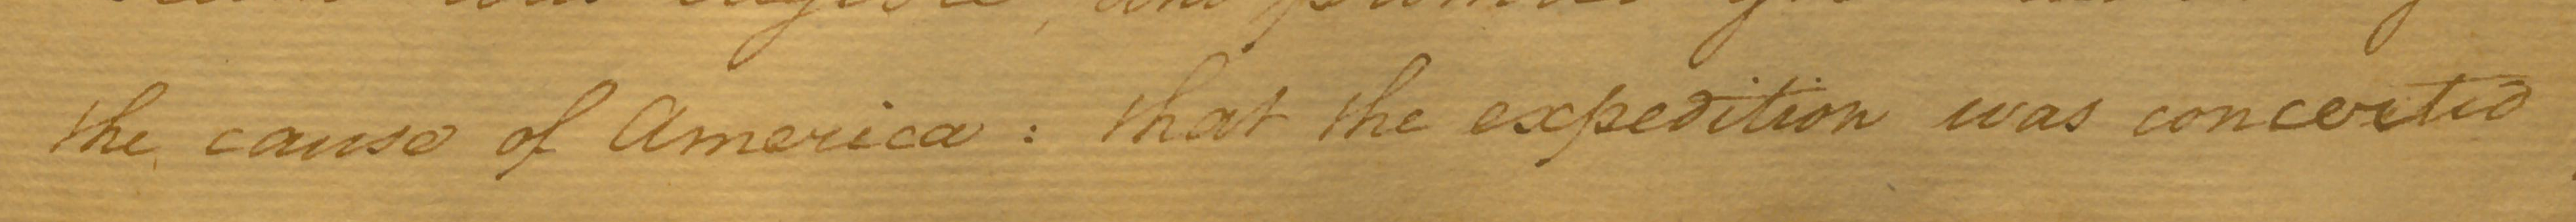the cause of America: that the expedition was concerted
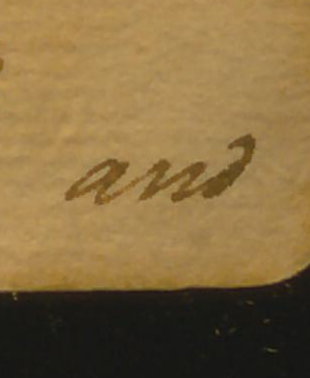and
